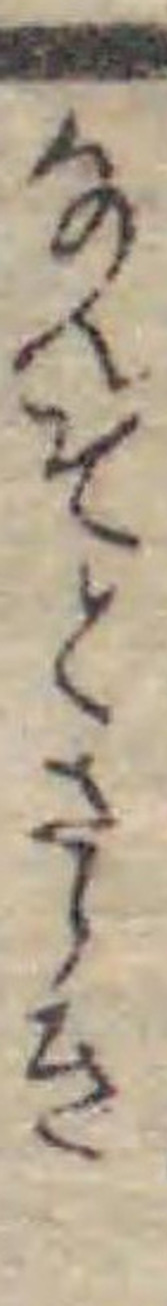なんそとさしき
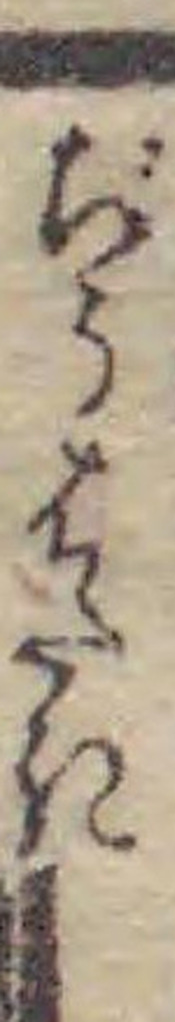ぢうはたき
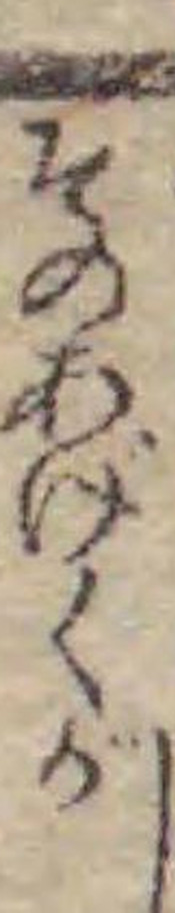そのあげくが
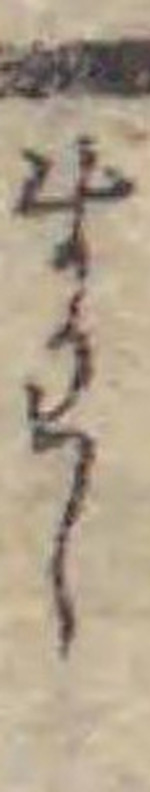まわし
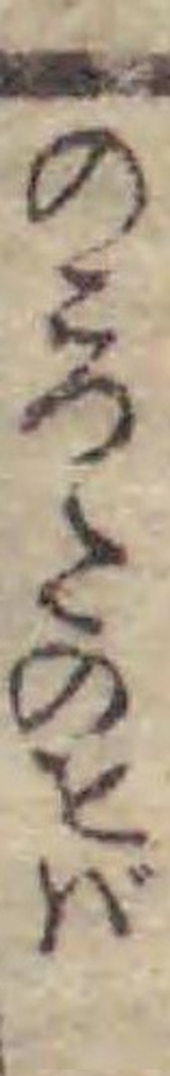のこつたのをば
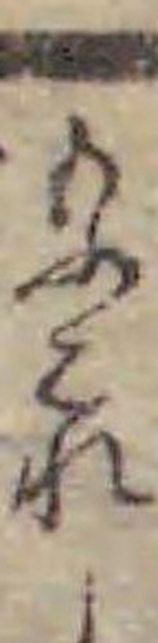もふこれ
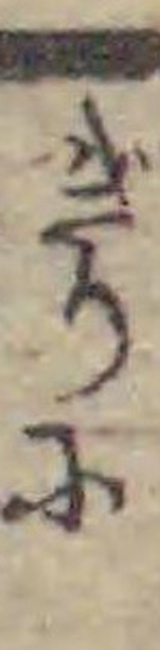ぎりに
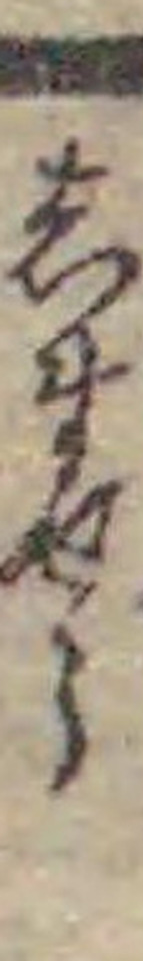しませう
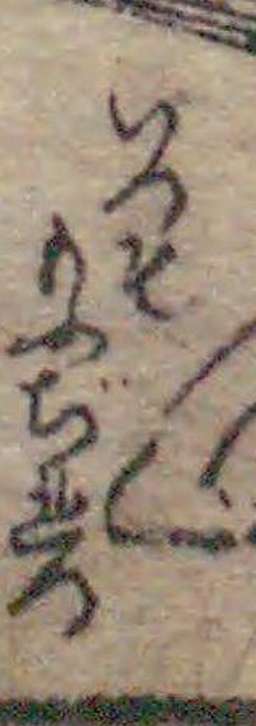もふぢれつ
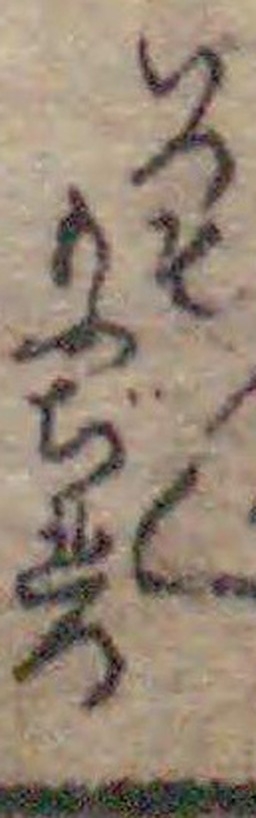もふぢれつ
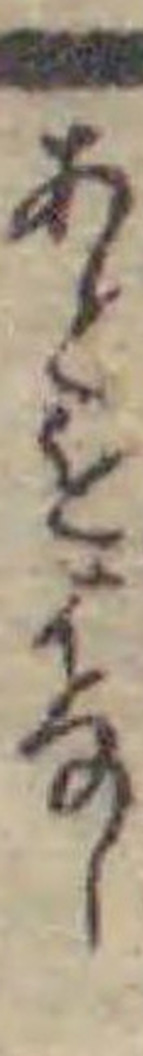あとをはなし

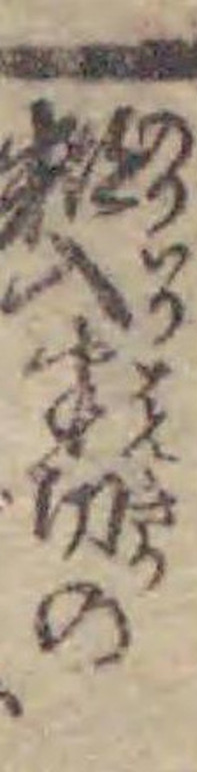糊入半切の
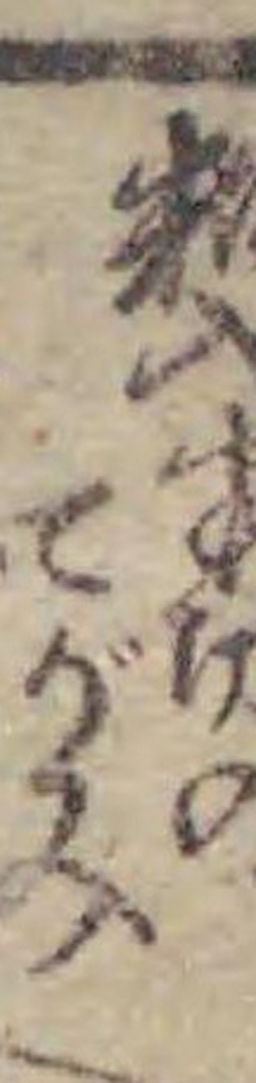てがみ
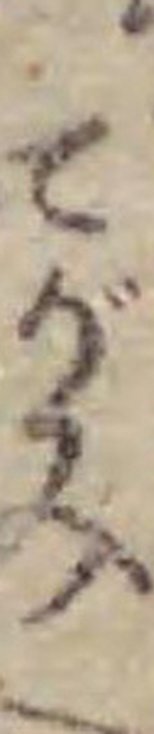てがみ
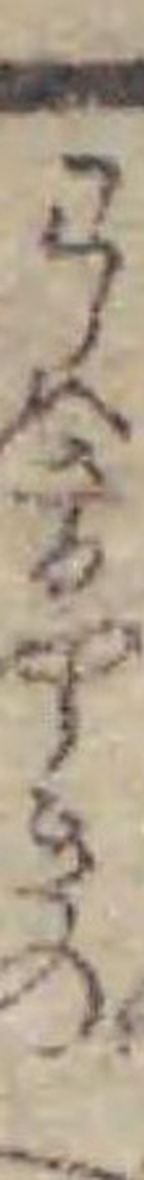わしはさるやしきの
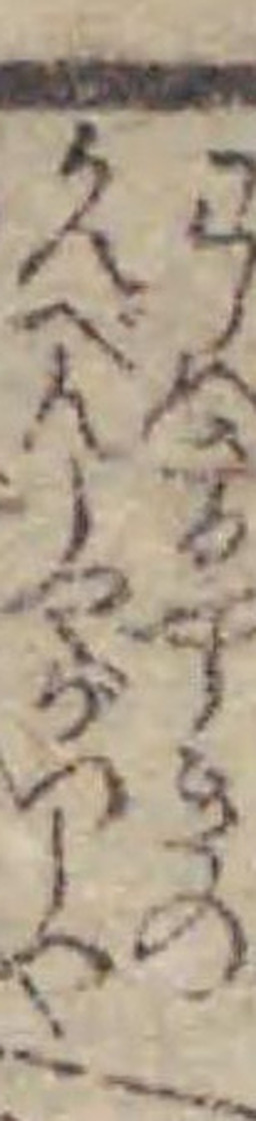かんべんしやがいしや
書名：紙屑身上噺 : 3巻
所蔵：国立国会図書館 National Diet Library, JAPAN
